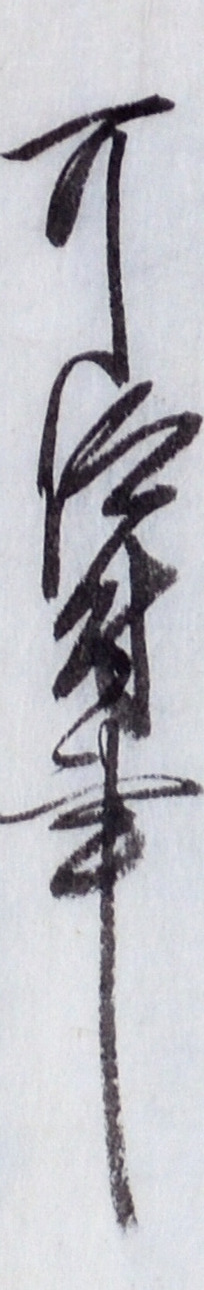可仰付事
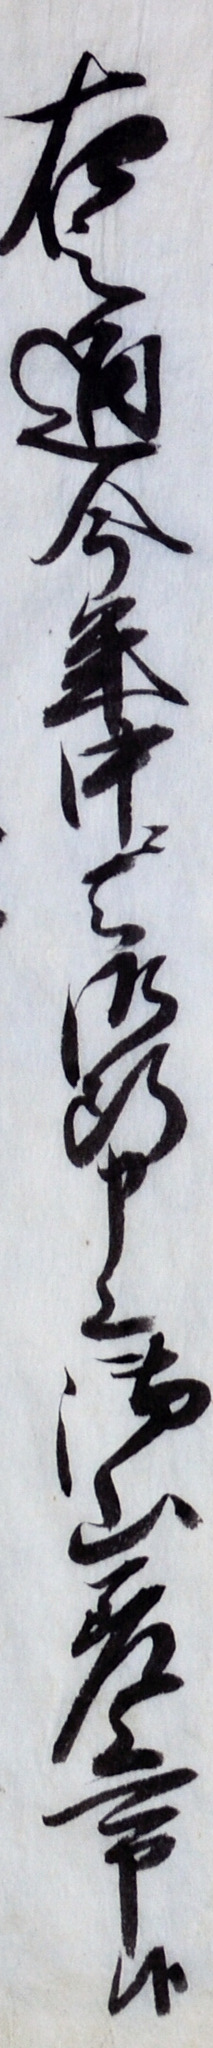右之通今年中ニ者御断申上御山差上可申候
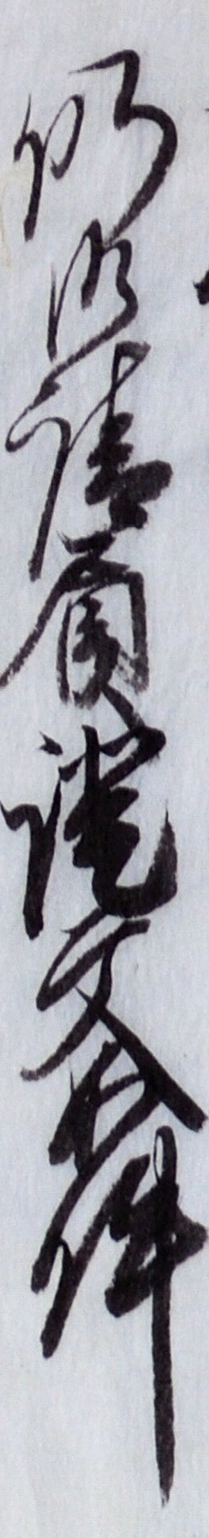仍御請負証文如件
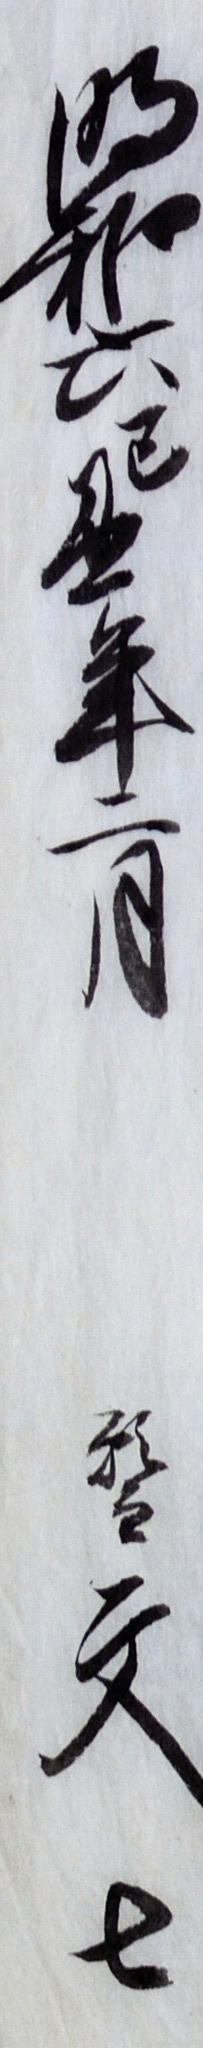明和六己丑年二月山室村

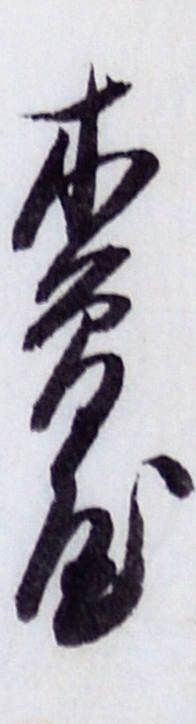木曽屋
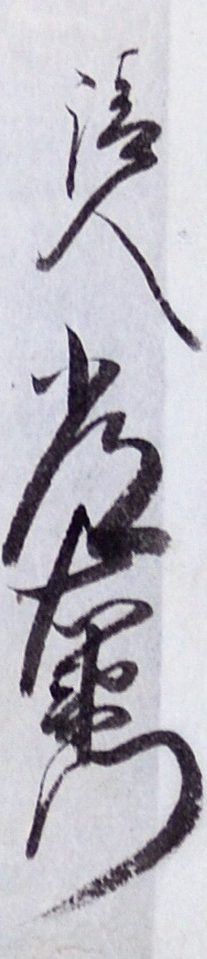請人常右衛門
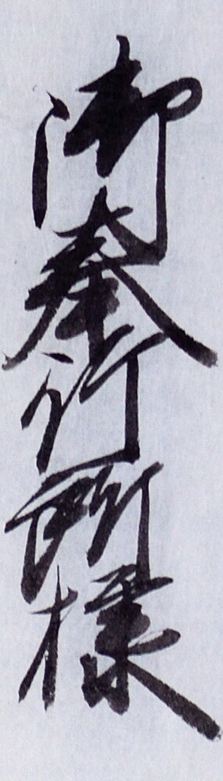御奉行所様
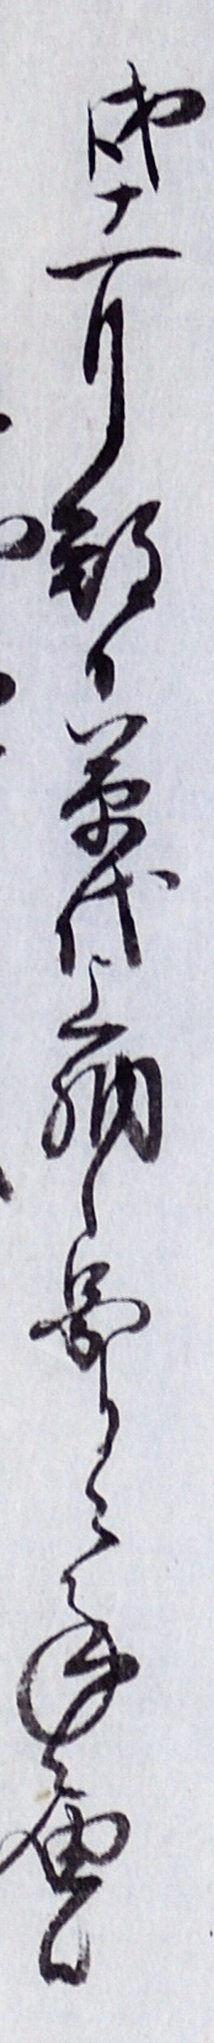戌十一月朔日草代上納之図りニて承届候
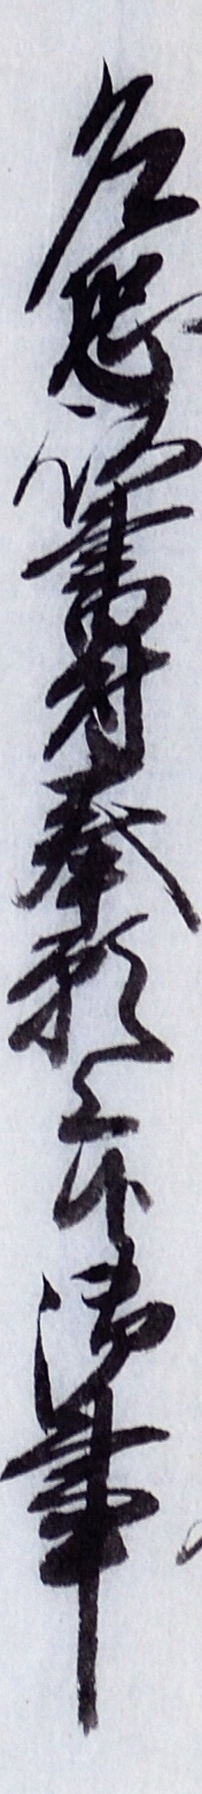乍恐以書付奉願上候御事
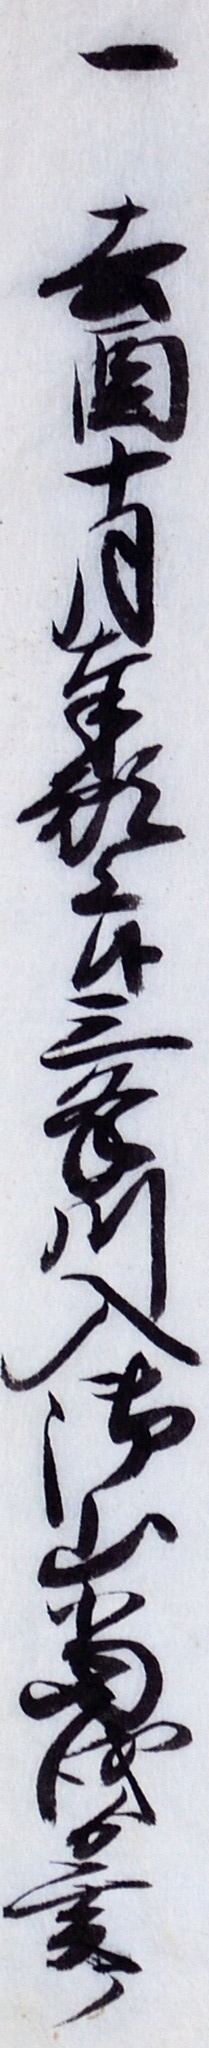一去酉十月奉願上候三峯川入御山当戌ゟ亥ノ
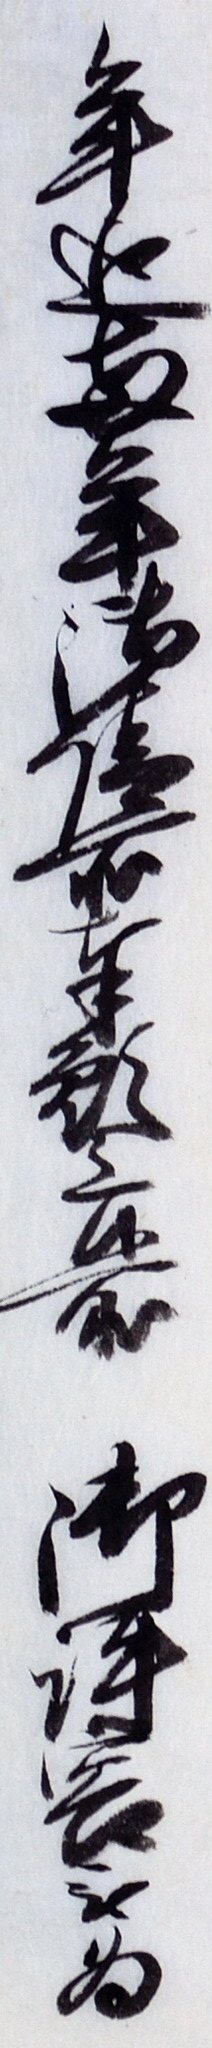年迄両年御請所奉願上候所御許容被為
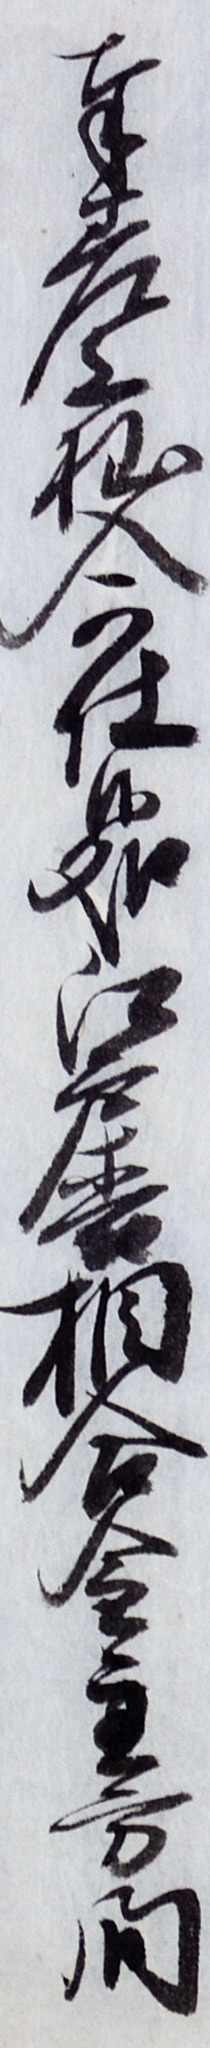奉差上杣入可仕候処江戸番相合金主方間
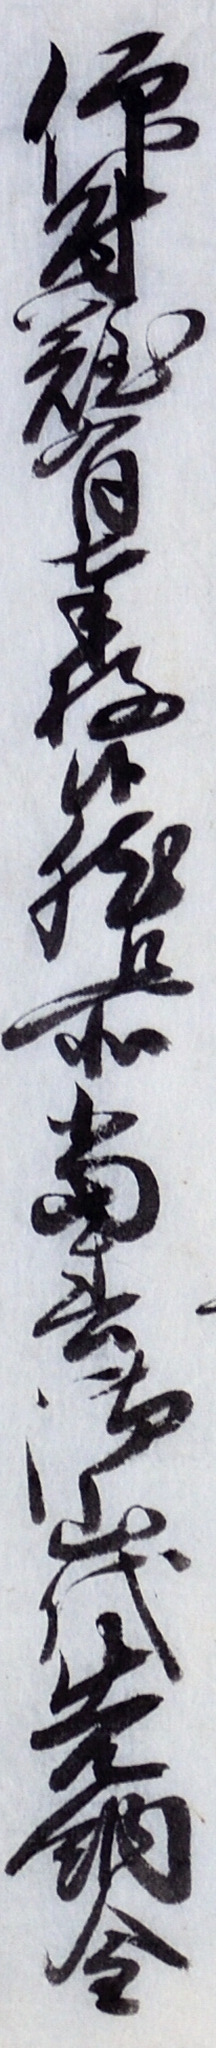仰付難有奉存候然ル所当春御山代先納金
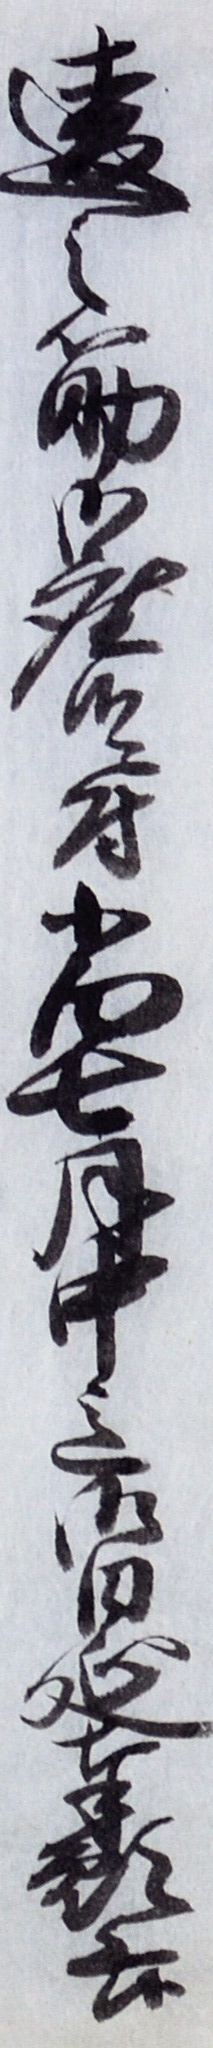違之筋御座候ニ付当七月中迄御日延奉願上候
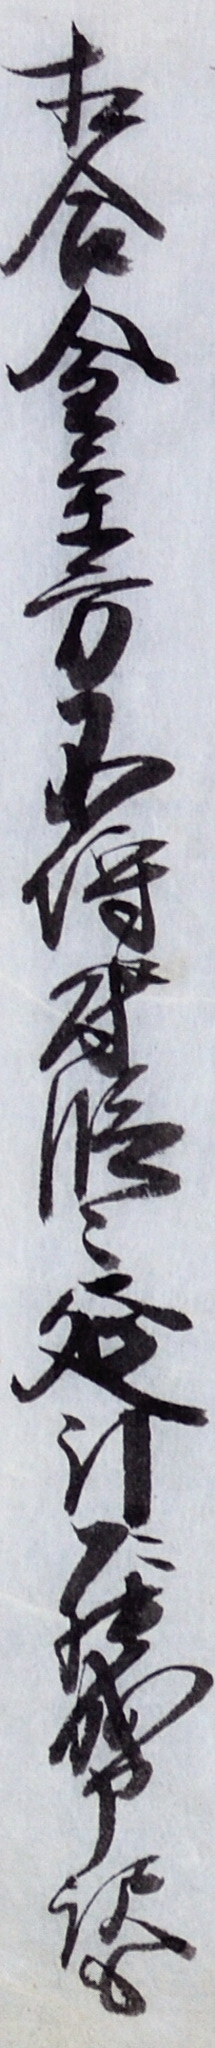相合金主方不埒ニ付段々延引ニ罷成申訳も
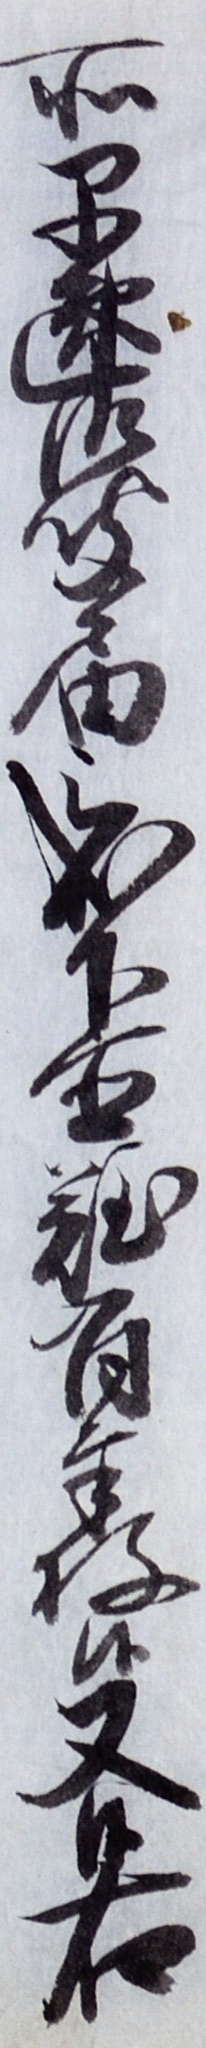所早速御聞届被成下置難有奉存候又候右
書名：御持山御払掟書願書控
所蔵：伊那市立高遠町図書館・合同会社AMANE
